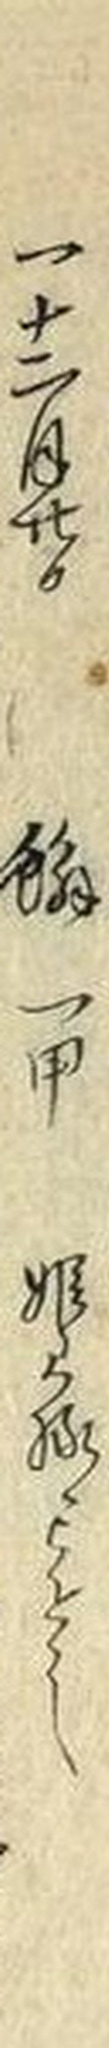一十二月廿日蟹一甲姫君様へ被進之
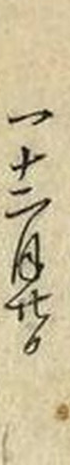一十二月十六日
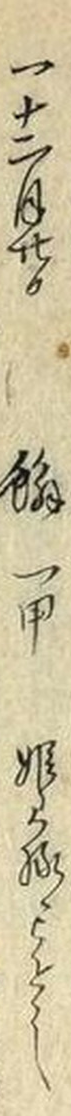一十二月廿日蟹一甲姫君様へ被進之
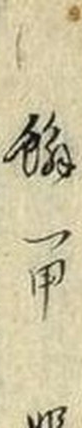蟹六甲
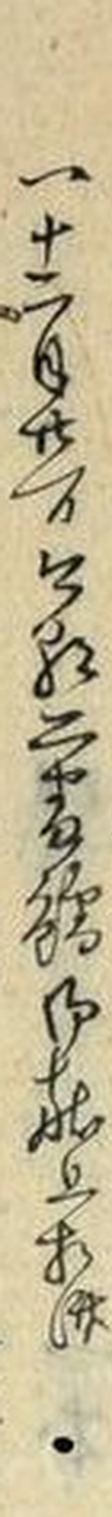一十二月廿一日今朝二番鱈御献上相済
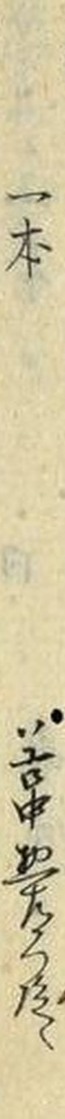生鱈一本谷中惣左衛門殿へ

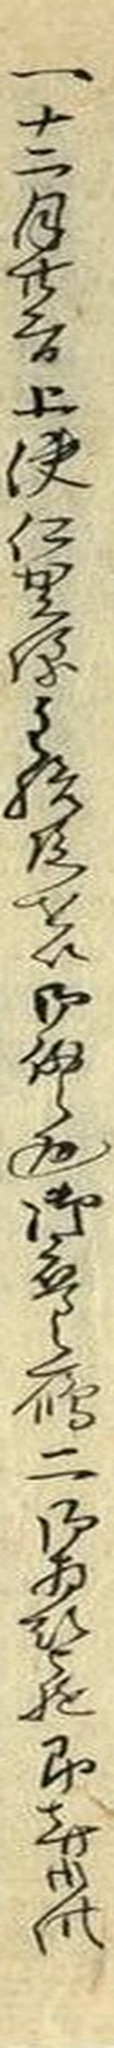一十二月廿二日上使仁賀保主膳殿を以御例之通御鷹之鴈二御拝領被遊即刻御供
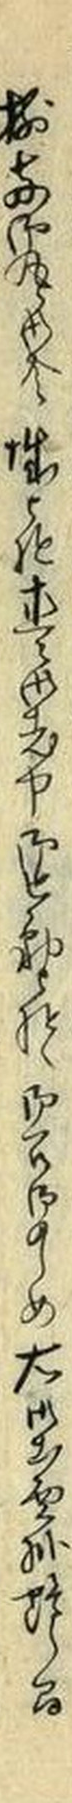揃両御丸御登城被遊直ニ御老中御廻勤被遊候御召御のしめ右御出殿掛鶴之間
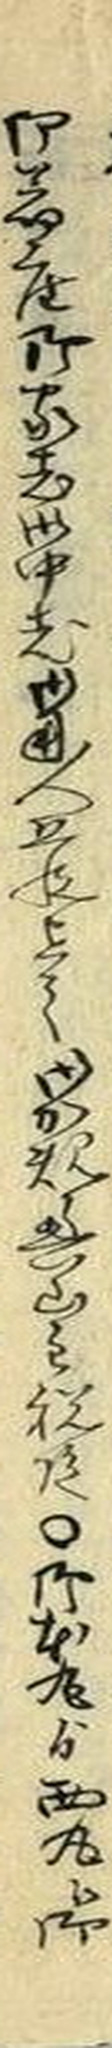御着座御家老御中老御用人恐悦申上之御加規奥山主税殿〇御本丸ゟ西丸江御
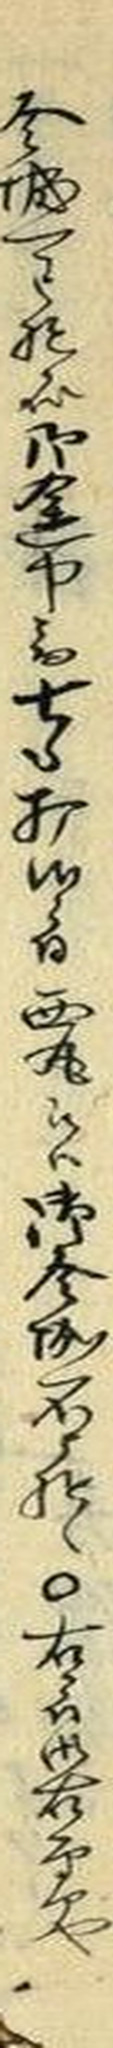登城可被遊候処御途中ニ而七ツ打候ニ付西丸江ハ御登城不被遊候〇右ニ付御右筆部や
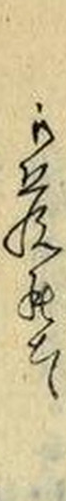江恐悦罷出候
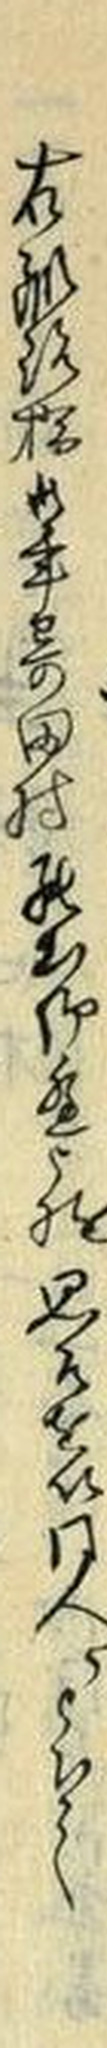右鍛冶橋御年寄田村罷出御逢被遊思召を以同人へ被下之
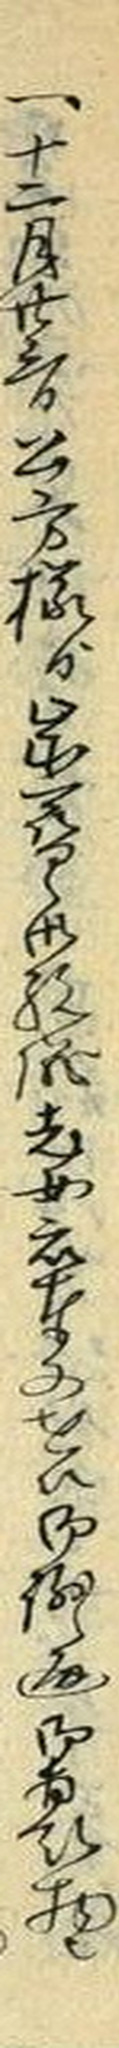一十二月廿三日公方様ゟ歳暮之御祝儀老女衆奉文を以御例之通御拝領物被
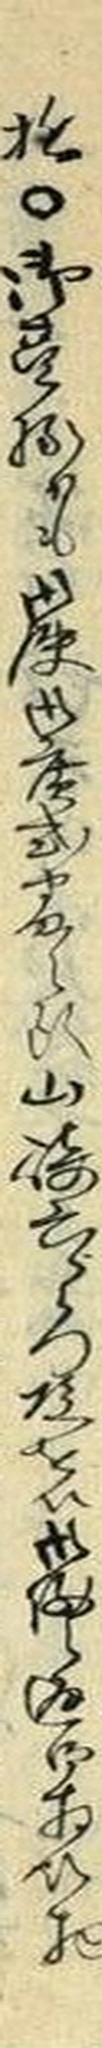遊〇御台様ゟも御使御広式番之頭山崎六郎右衛門殿を以御例之通御拝領物
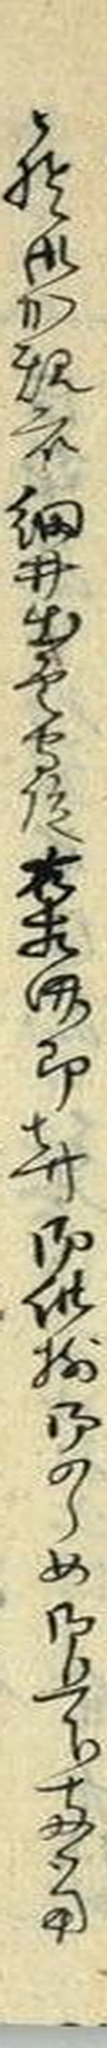被遊候御加規衆細井出雲守殿右相済即刻御供揃御のしめ御上下両御用
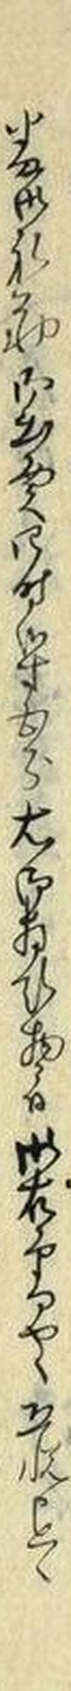番御礼勤御出殿四時弐寸五分右御拝領物ニ付御右筆部やへ恐悦申上候
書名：少傅日録抄（斉承付側向頭取日記、在府）
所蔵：福井県文書館 Fukui Prefectural Archives
